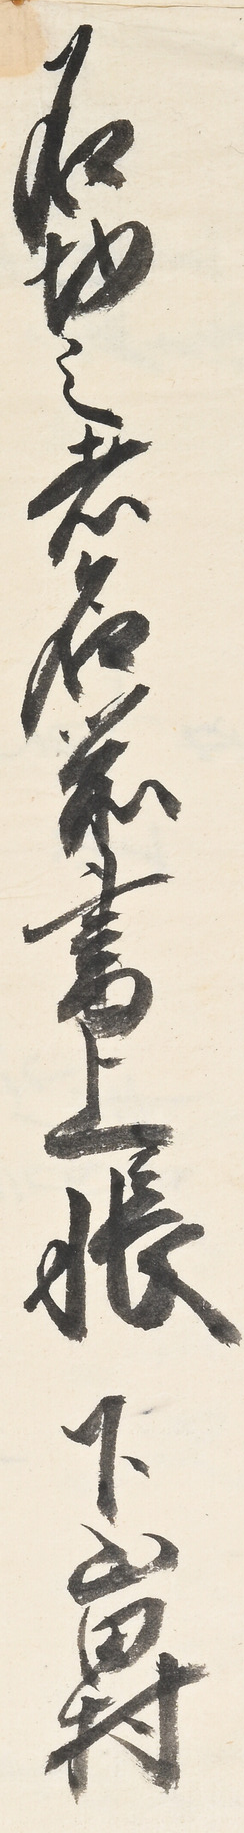石切之者名前書上帳下山田村

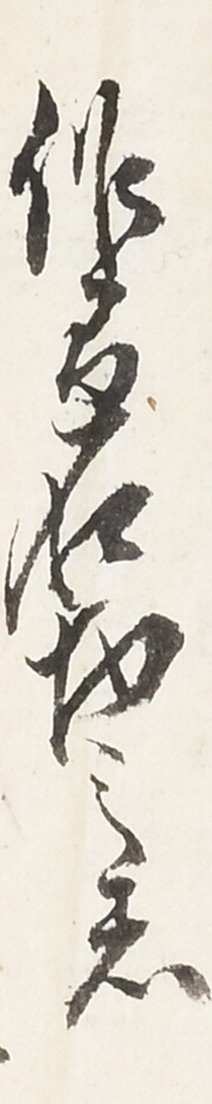作間石切之者
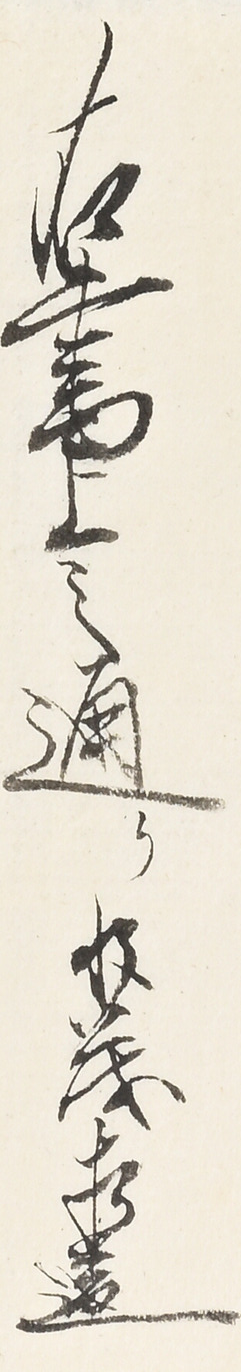右書上之通り少茂相違
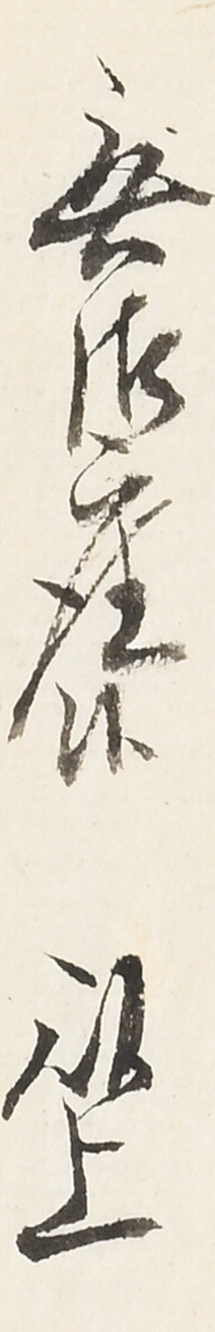無御座候以上
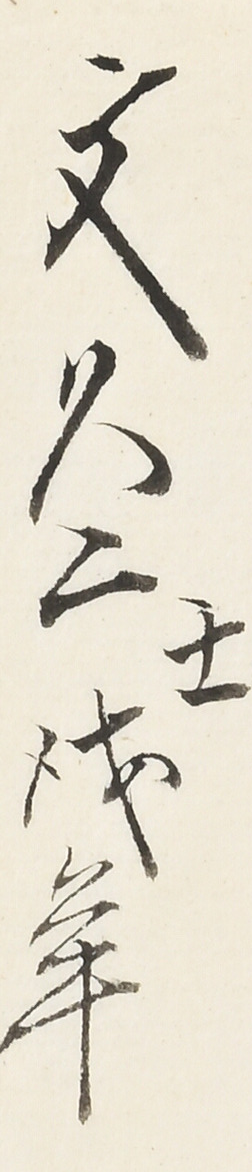文久二壬戌年

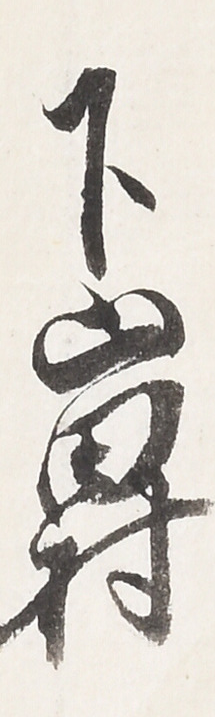下山田村
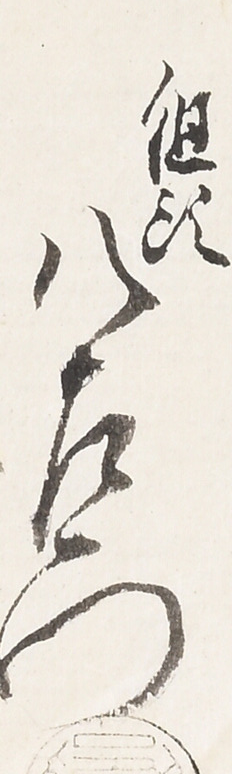組頭八左衛門
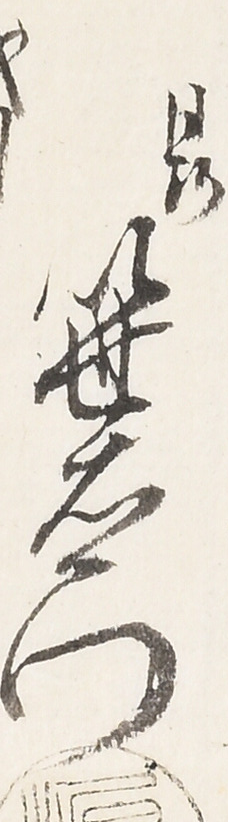同断笹右衛門㊞
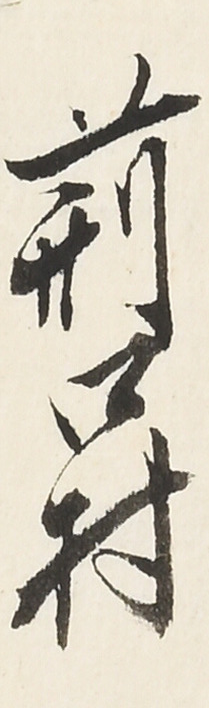荊口村
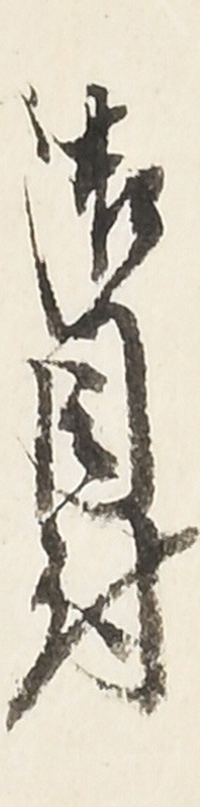御目付
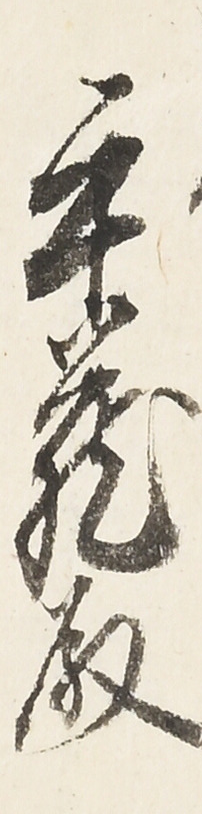平蔵殿
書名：文久二壬戌年二月日石切之者名前書上帳
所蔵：伊那市立高遠町図書館・合同会社AMANE
